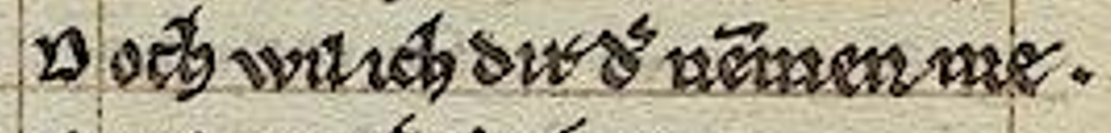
Doch wil ich dir d(er) ne(m)men me.
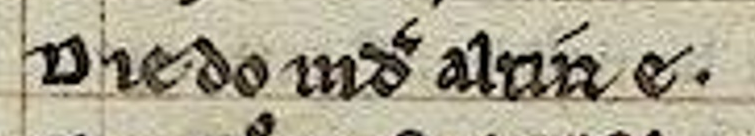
Die do ind(er) altin e.
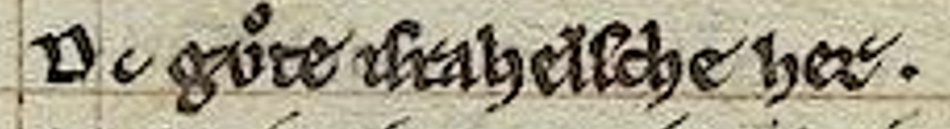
D(az) gv°ote iſrahelſche her.
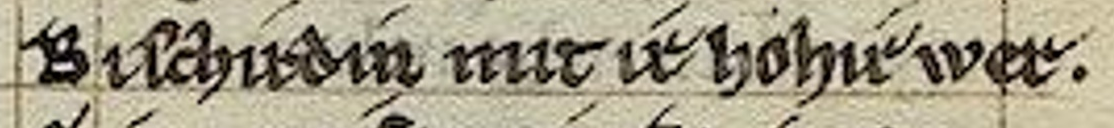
Biſchirdin mit ir hohir wer.
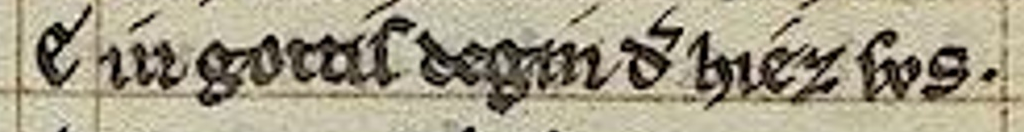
Ein gottiſ degin d(er) hiez ſvs.
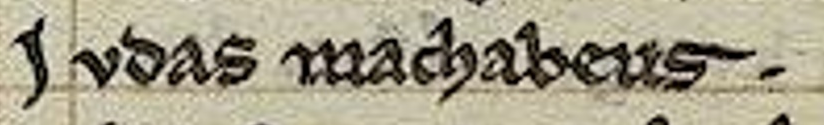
Jvdas machabeus.
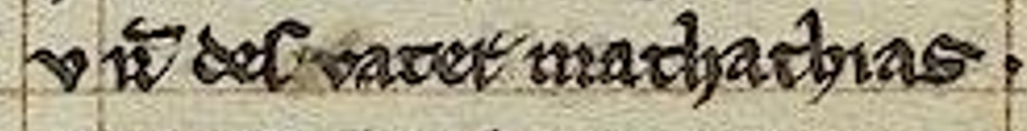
Vn(d) deſ vater mathathias.
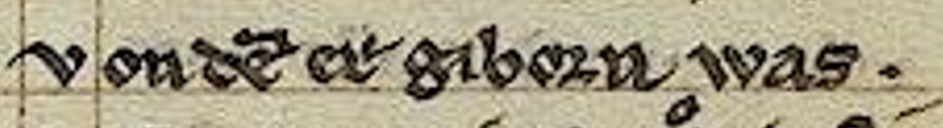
Von de(m) er giborn was.
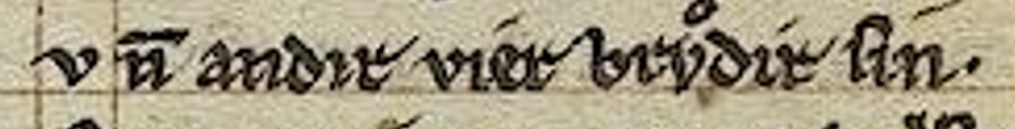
Vn(d) andir vier brv°odir ſin.
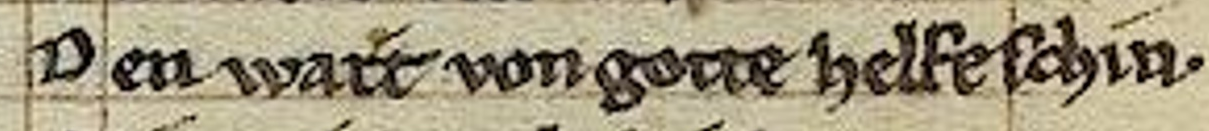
Den wart von gotte helfe ſchin.
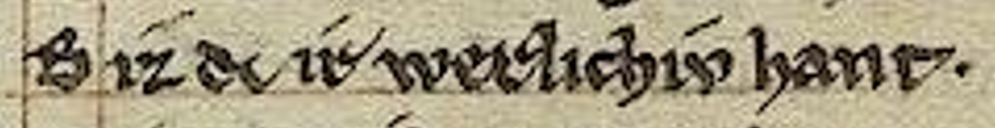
Biz d(az) ir werlichiv hant.
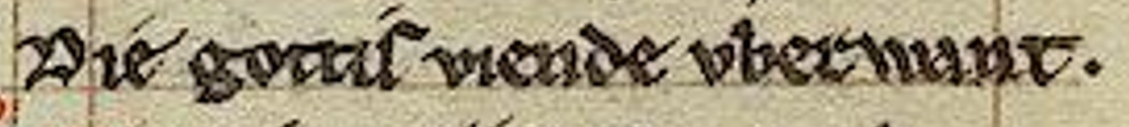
Die gottiſ viende vberwant.
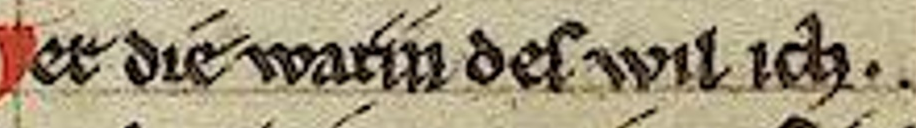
*Wer die warin deſ wil ich.
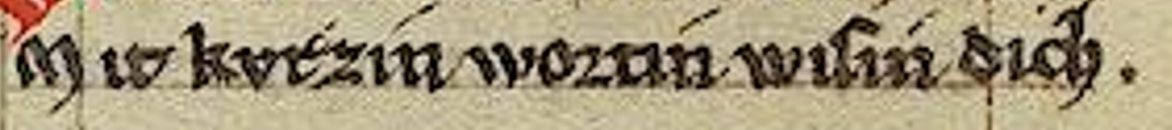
Mit kvrzin wortin wiſin dich.
